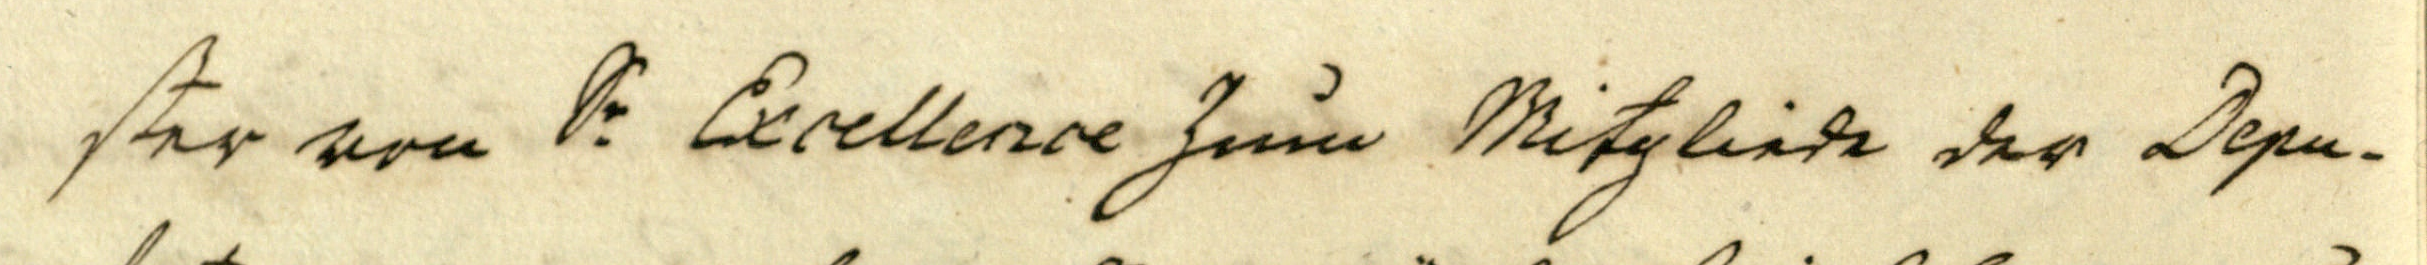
ster von Sr. Excellence zum Mitgliede der Depu¬
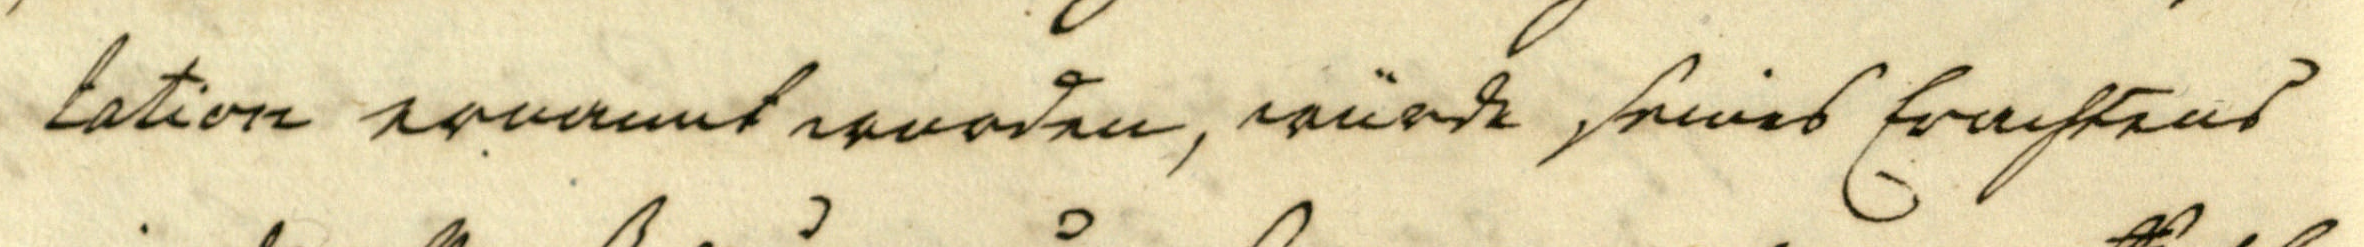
tation ernannt worden, würde seines Erachtens
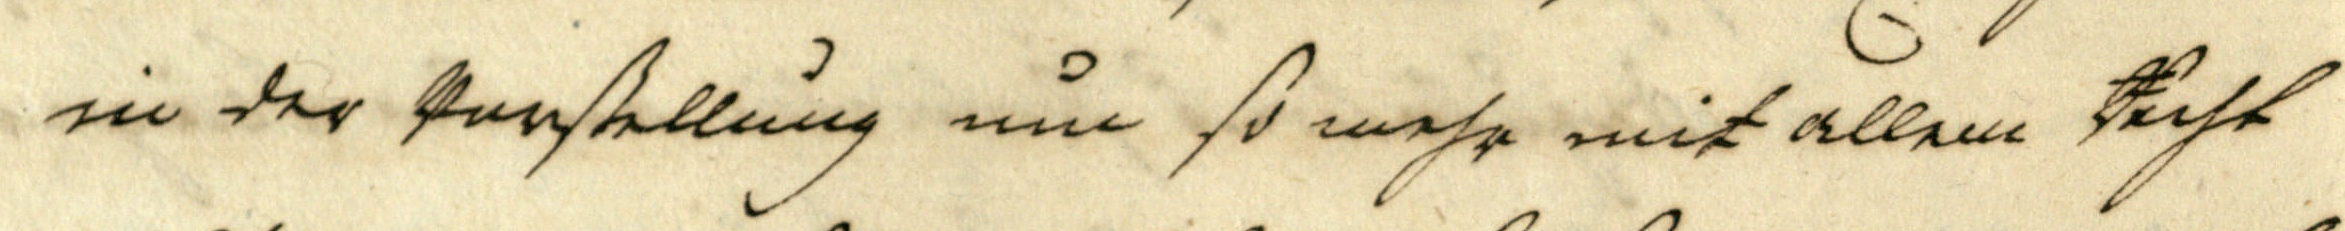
in der Vorstellung um so mehr mit allem Recht
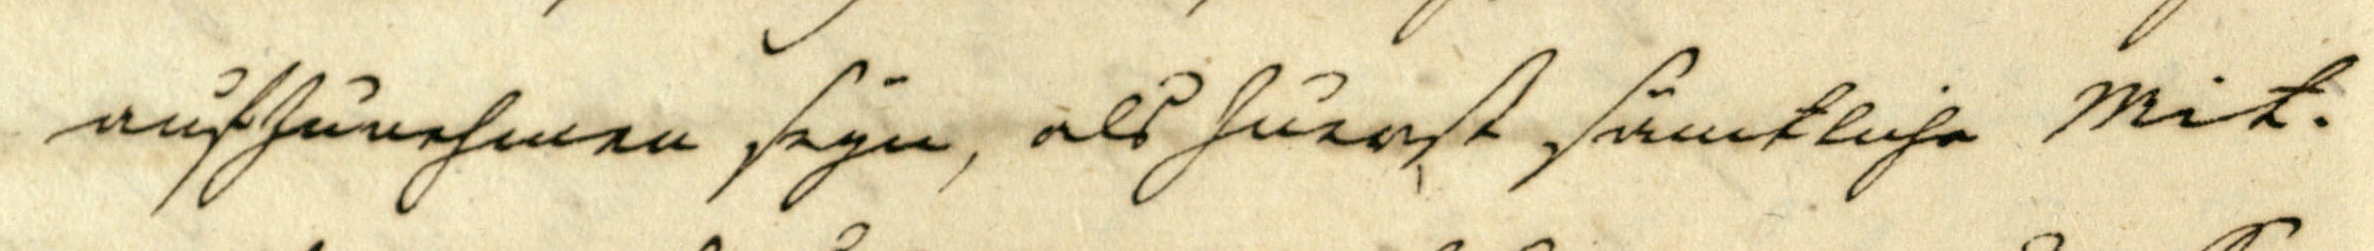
aufzunehmen seÿn, als zuerst sämtliche Mit¬
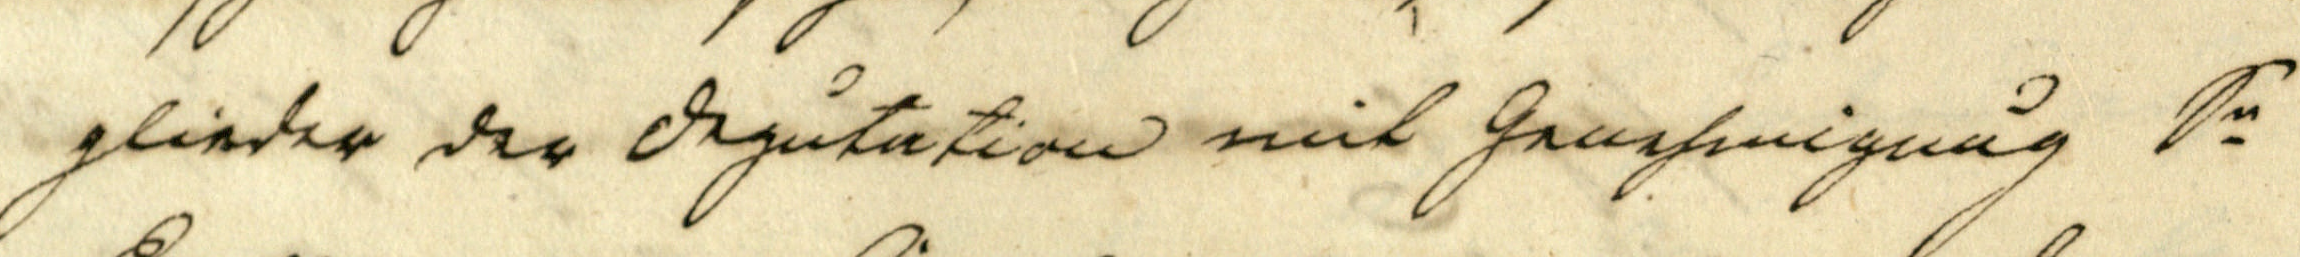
glieder der Deputation mit Genehmigung Sr
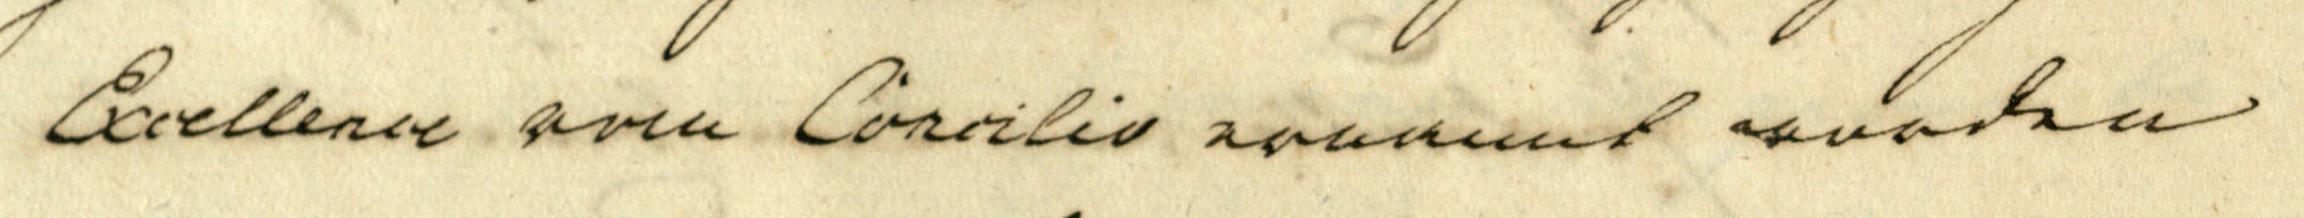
Excellence vom Concilio ernannt worden
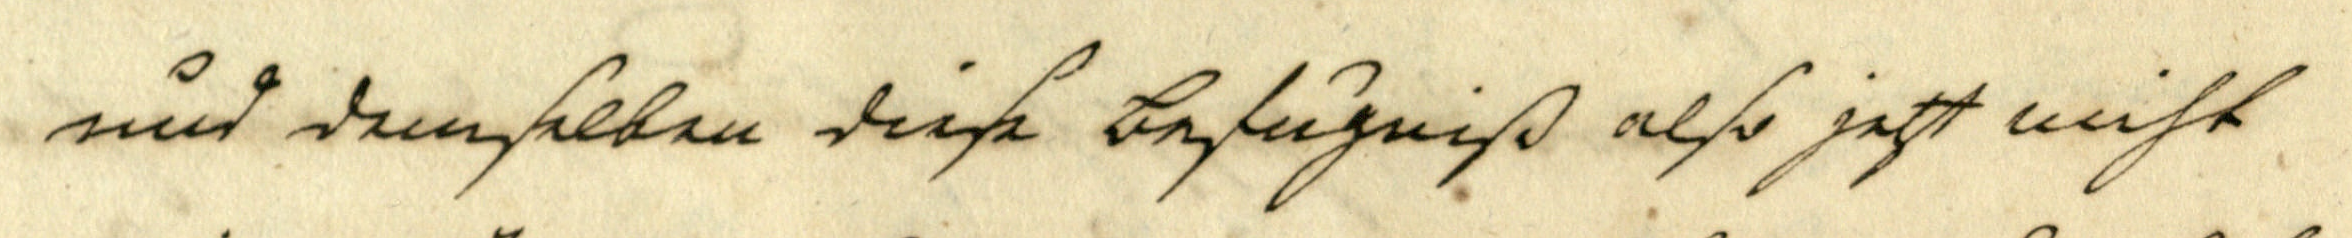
und demselben diese Befugniß also jetzt nicht
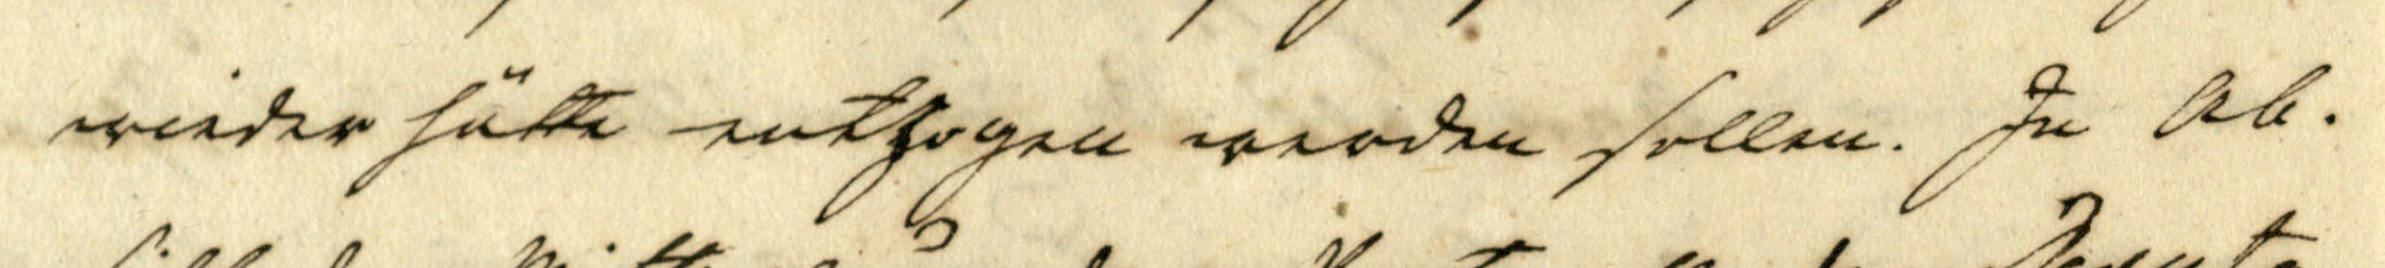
wieder hätte entzogen werden sollen. In Ab¬
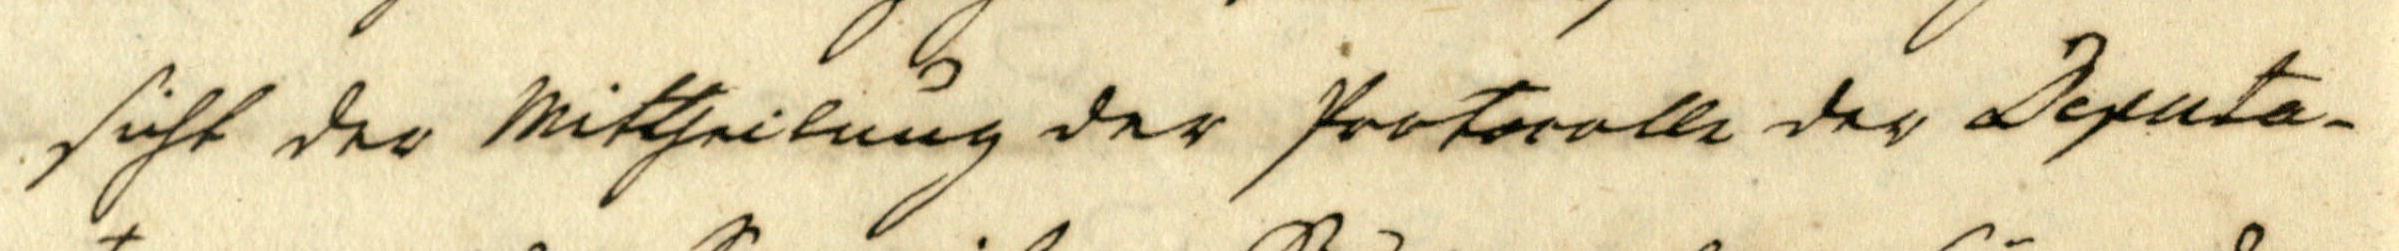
sicht der Mittheilung der Protocolle der Deputa¬
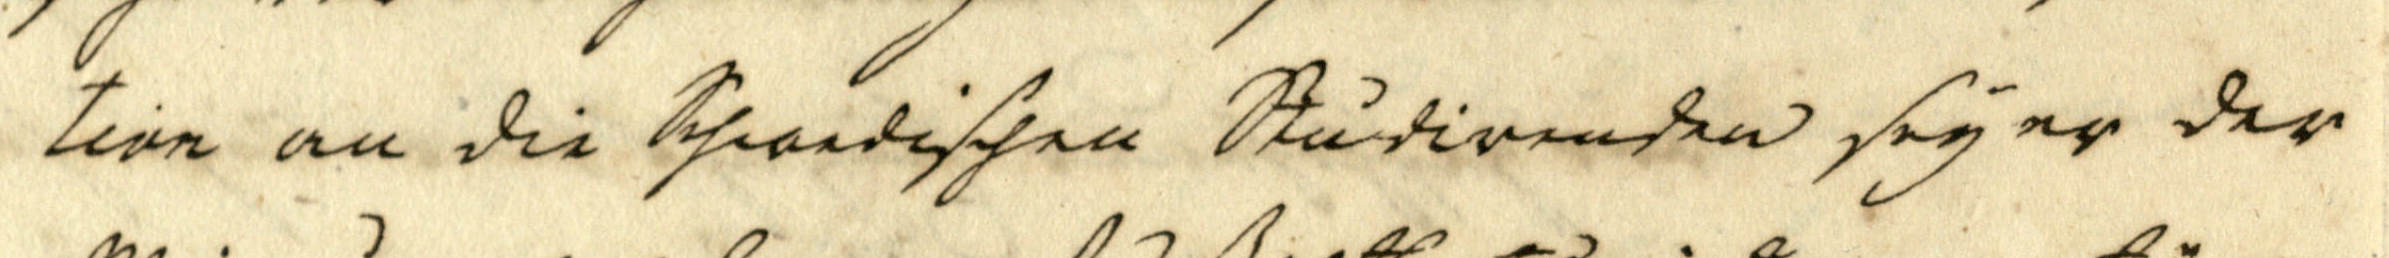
tion an die Schwedischen Studirenden seÿ er der
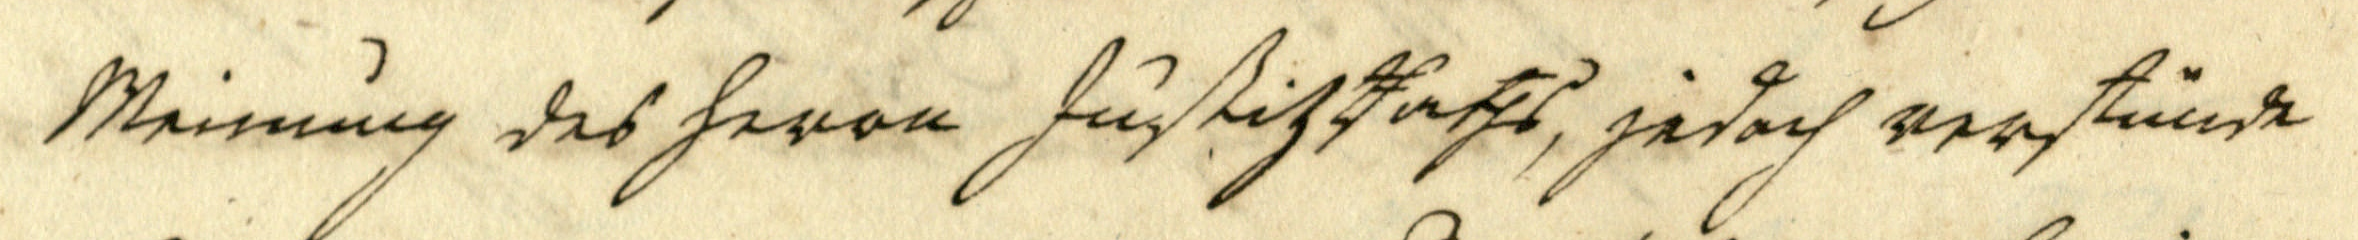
Meinung des Herrn JustizRaths, jedoch verstünde
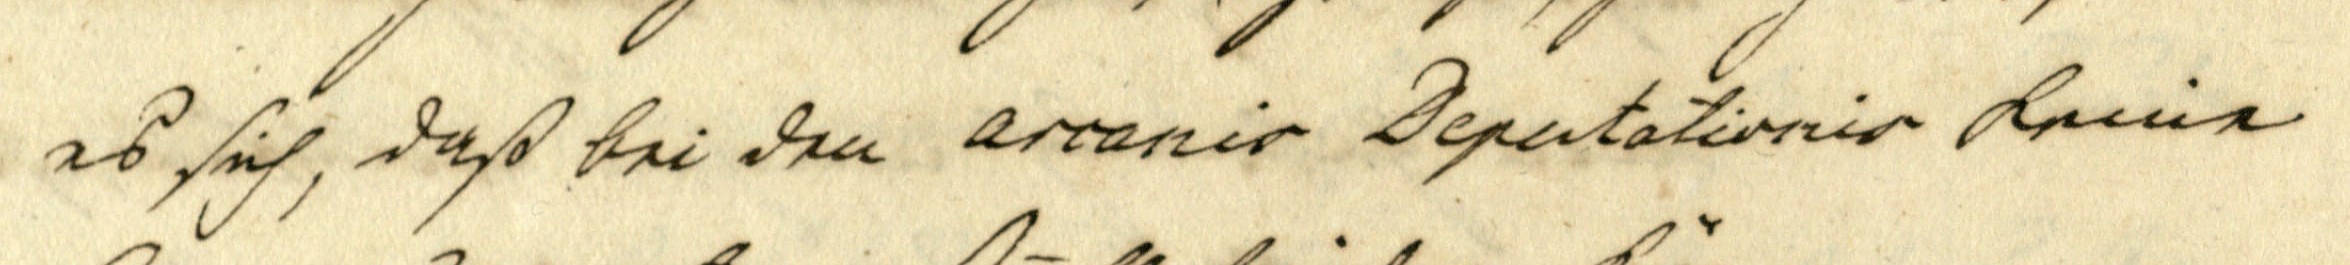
es sich, daß bei den arcanis Deputationis keine
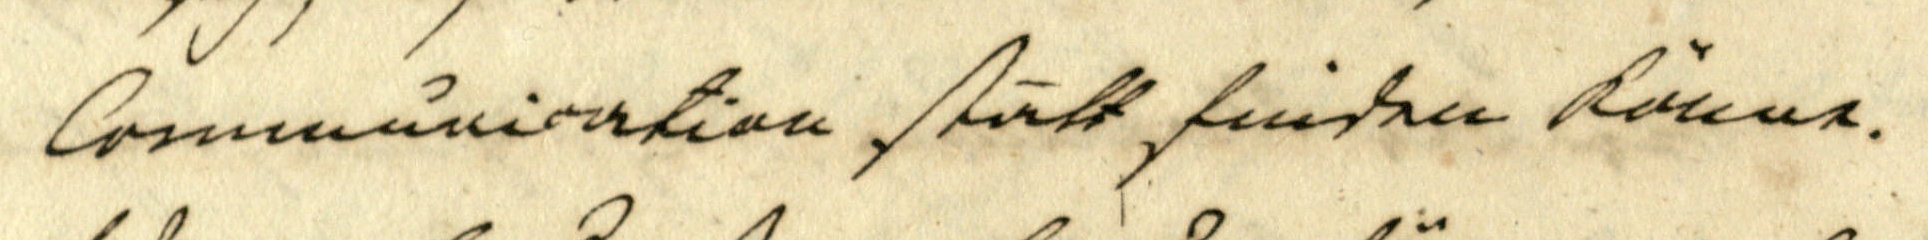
Communication statt finden könne.
